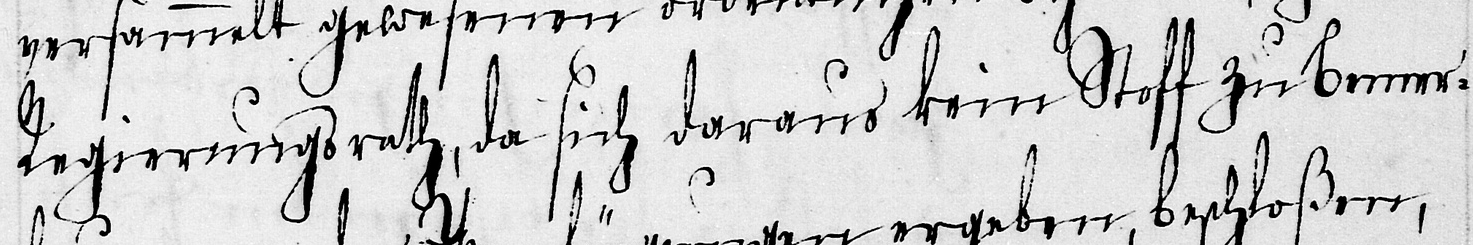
Regierungsrath, da sich daraus kein Stoff zu Bemer¬
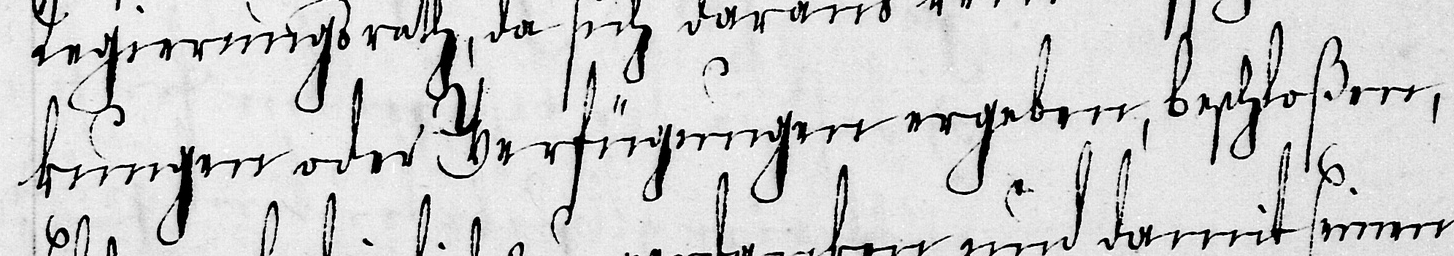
kungen oder Verfügungen ergeben, beschloßen,
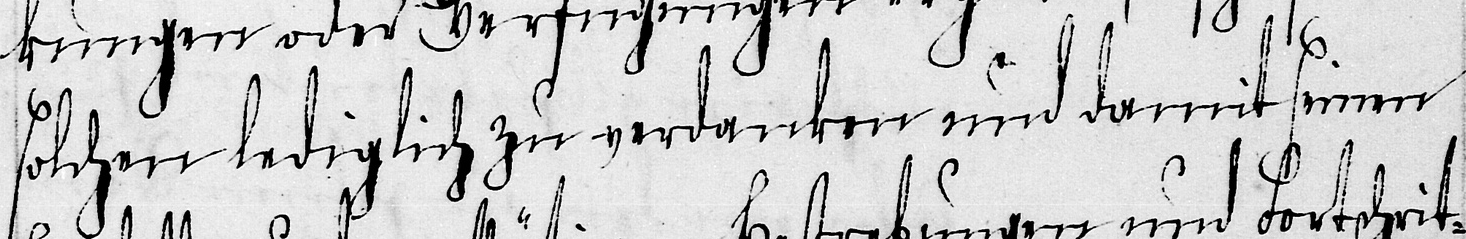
solchen lediglich zu verdanken und damit seinen
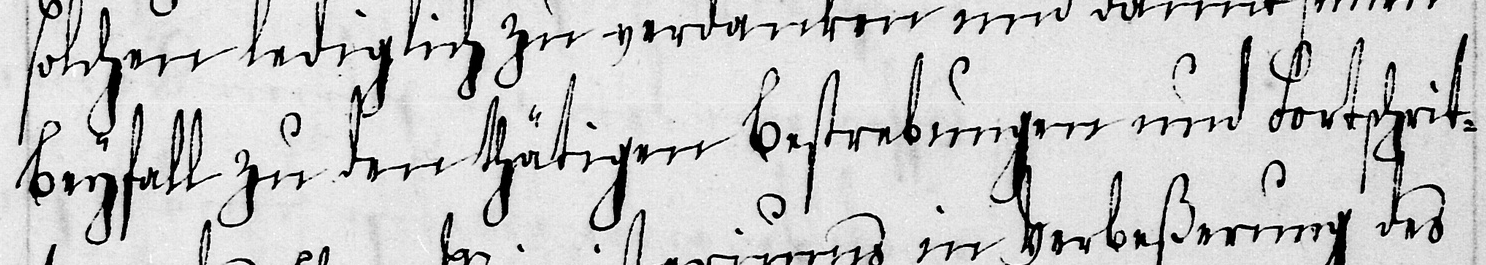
Beyfall zu den thätigen Bestrebungen und Fortschrit¬
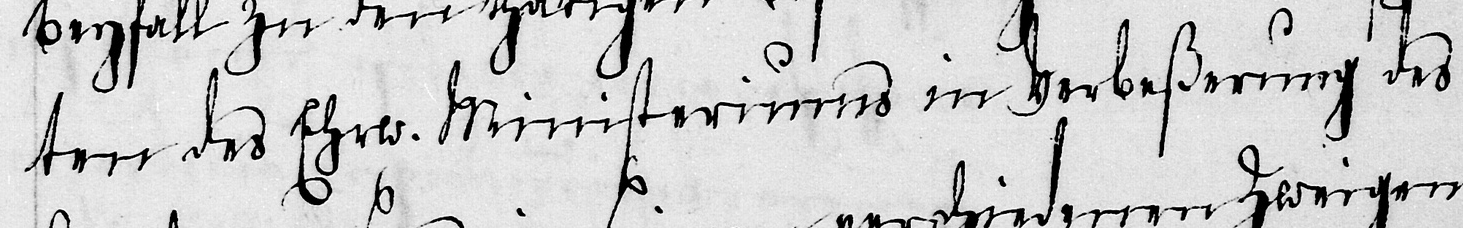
ten des Ehrw. Ministeriums in Verbeßerung des
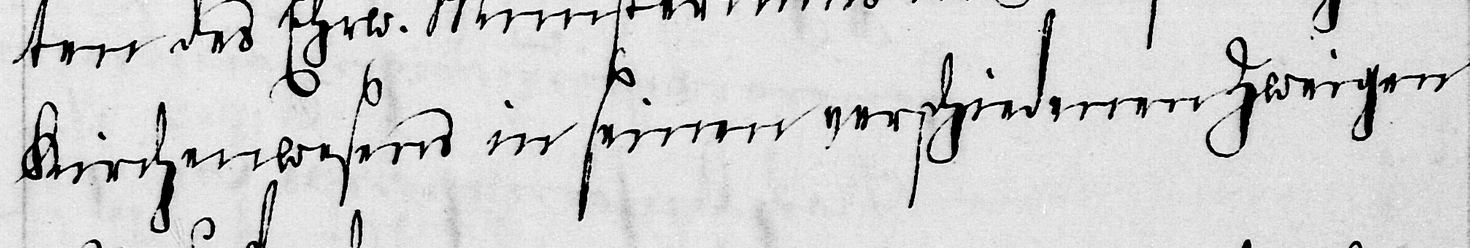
Kirchenwesens in seinen verschiedenen Zweigen
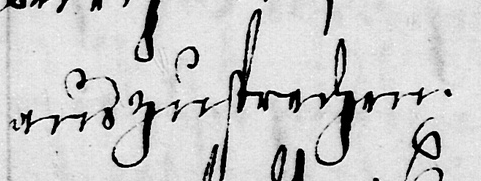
auszusprechen.
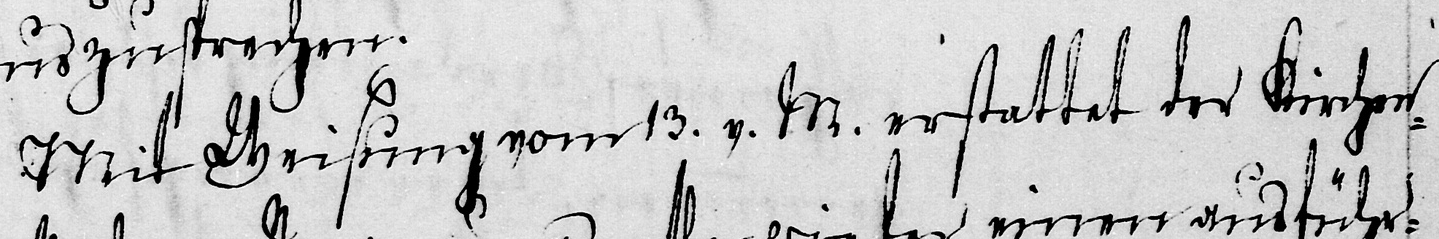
Mit Weisung vom 13. v. M. erstattet der Kirchen¬
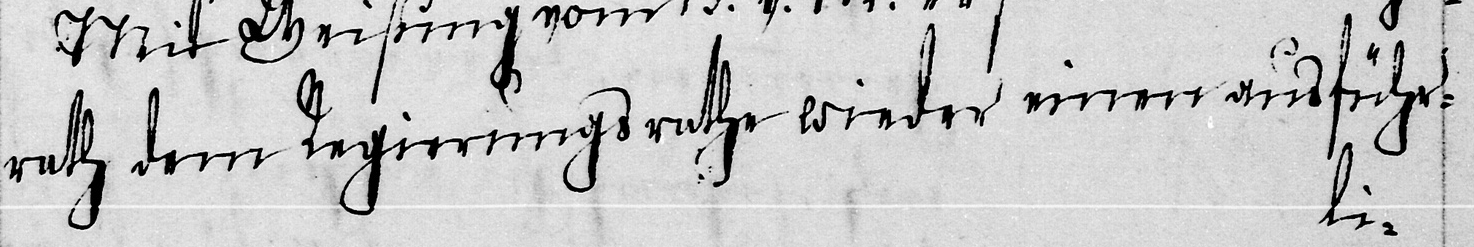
rath dem Regierungsrathe wieder einen ausführ-
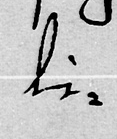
ein
